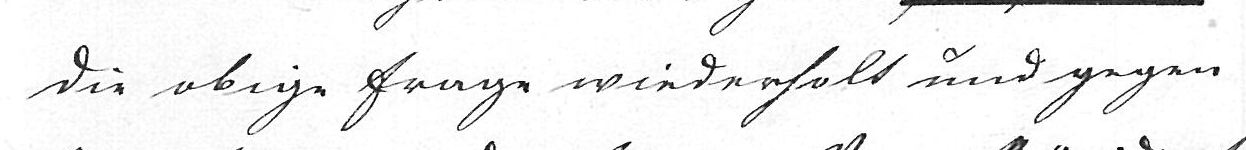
die obigen Frage wiederholt und gegen
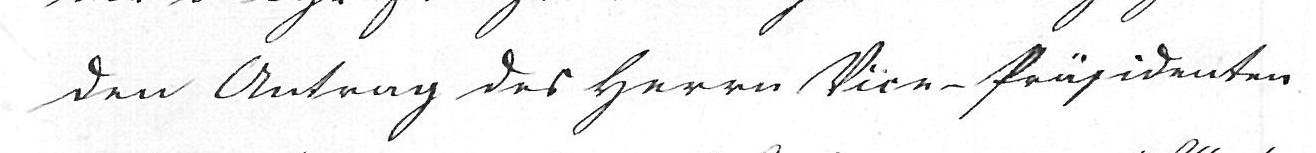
den Antrag des Herrn Vice-Präsidenten
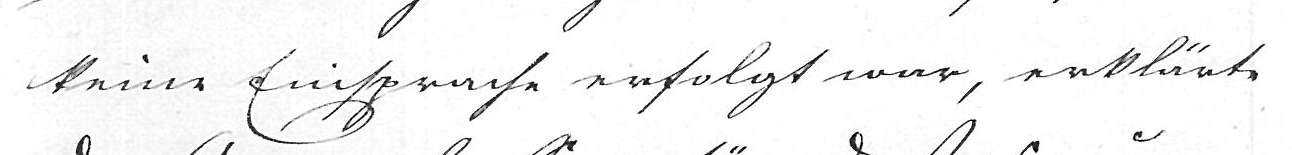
keine Einsprache erfolgte war, erklärte
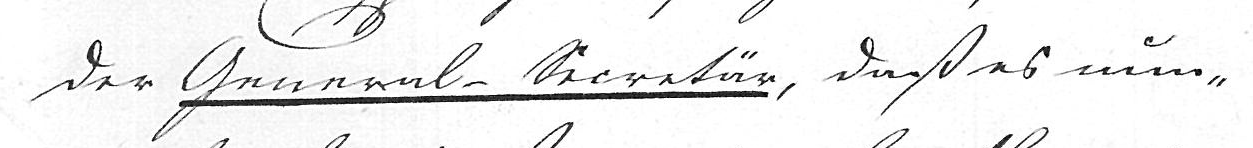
der General-Secretär, daß es nun-
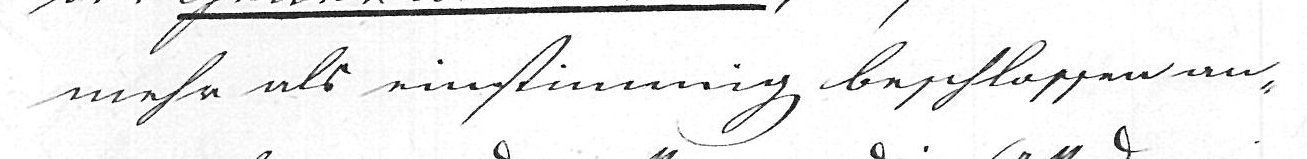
mehr als einstimmig beschlossen an-
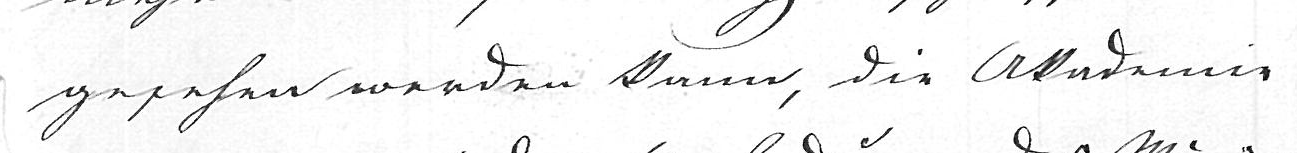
gesehen werden kann, die Akademie
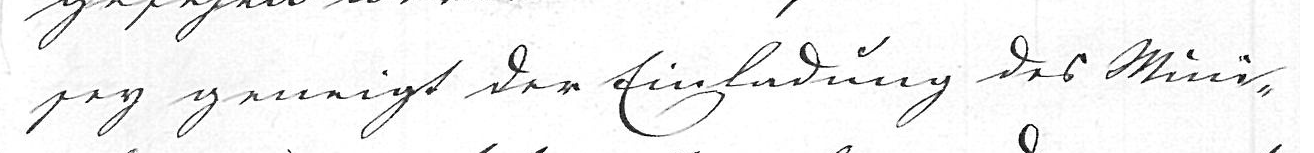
sey geneigt der Einladung des Mini-
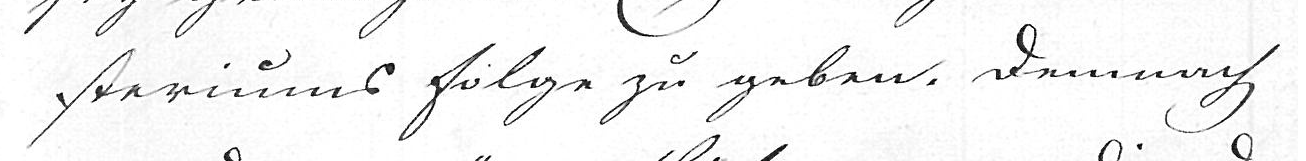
steriums Folge zu geben. Demnach
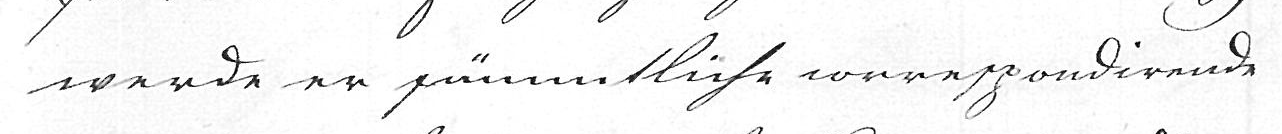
werde er sämmtliche correspondirende
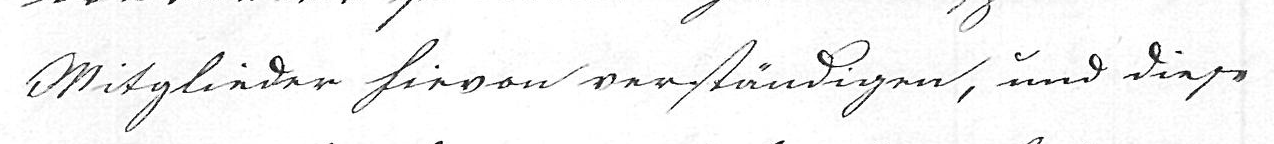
Mitglieder hievon verständigen, und diese
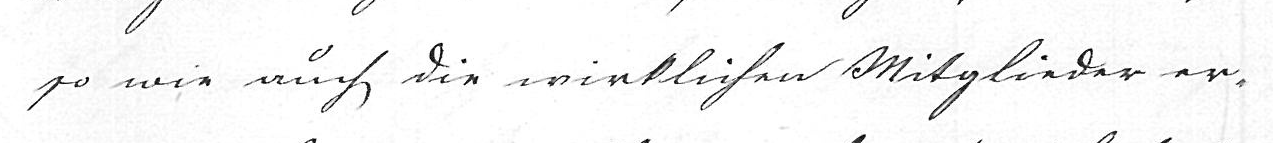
so wie auch die wirklichen Mitglieder er-
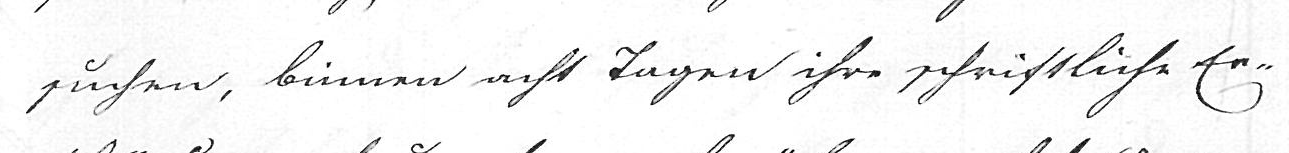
suchen, binnen acht Tagen ihre schriftliche Er-
